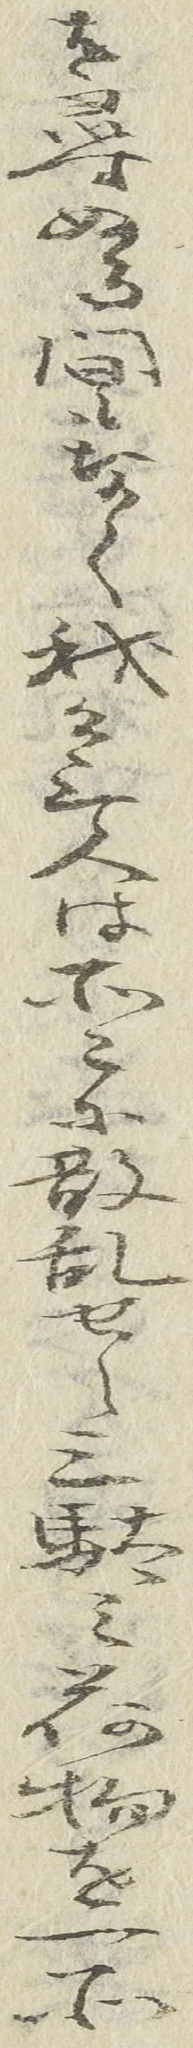を尋ぬる間もなく我々三人は所々に散乱せし三駄之荷物を一所
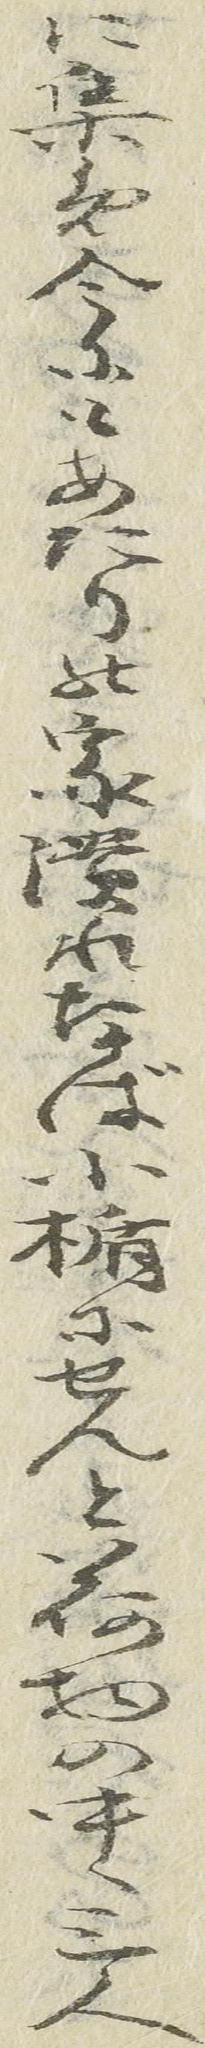に集め今にもあたりの家潰れなば小楯にせんと荷物の中へ三人
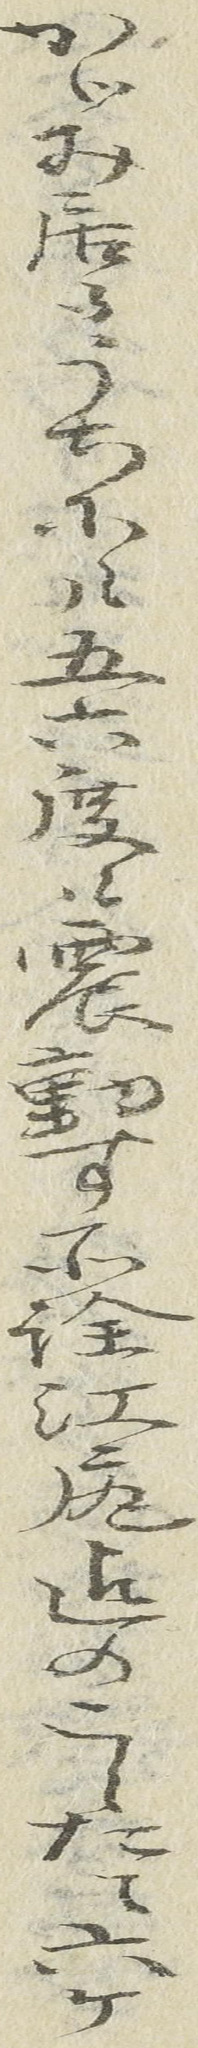かじみ居るうちにも五六度も震動す所詮江尻迄のこしたて六ケ
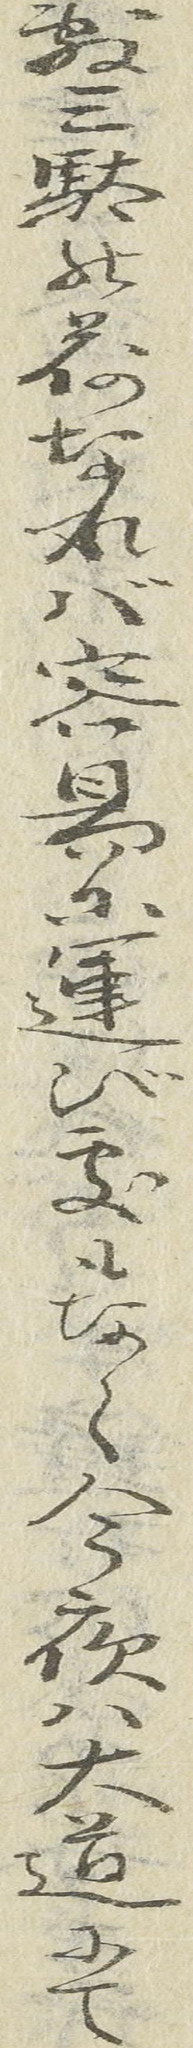處三駄の荷なれバ容易に運び處もなく今夜ハ大道にて
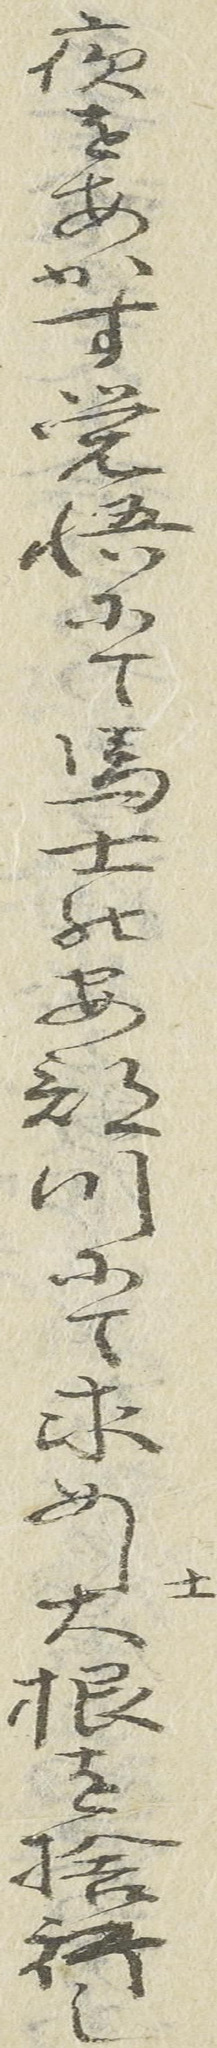夜をあかす覚悟にて馬士の安部川にて求めし大根を捨行し

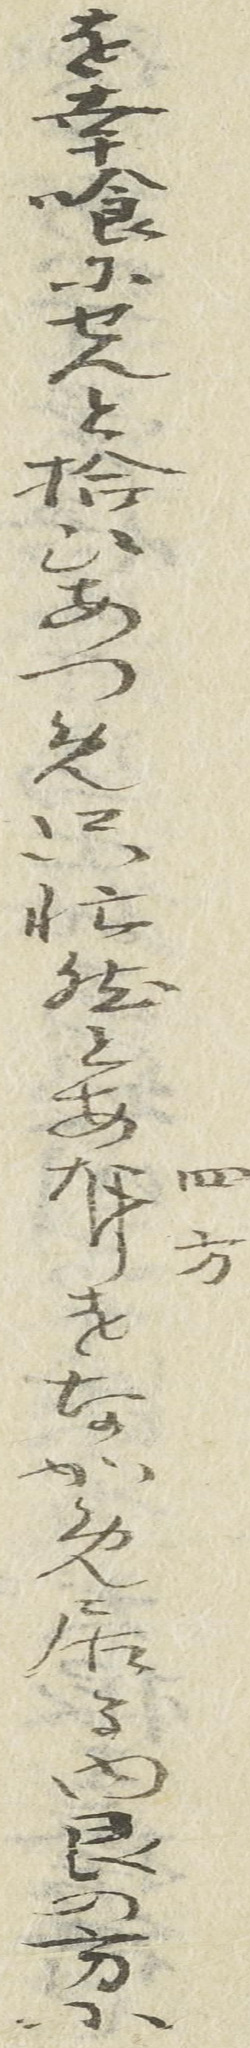を幸喰にせんと拾ひあつめ只忙然とあたりをながめ居る内艮の方に
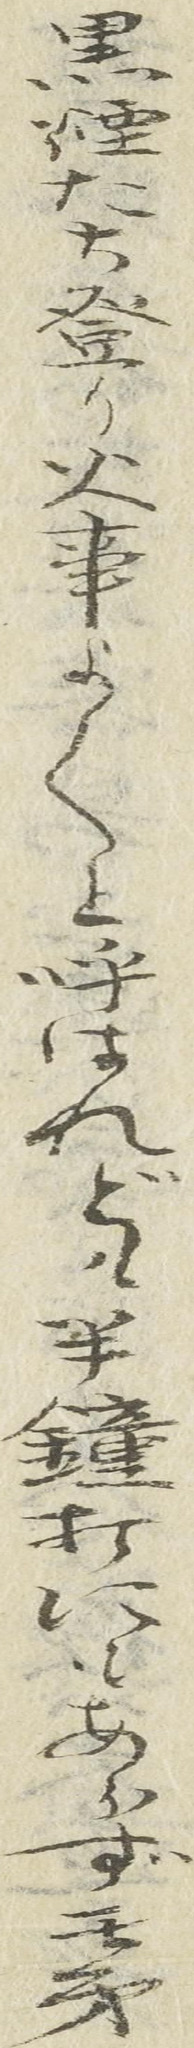黒煙たち登り火事よ〳〵と呼はれども半鐘打にもあらず次第
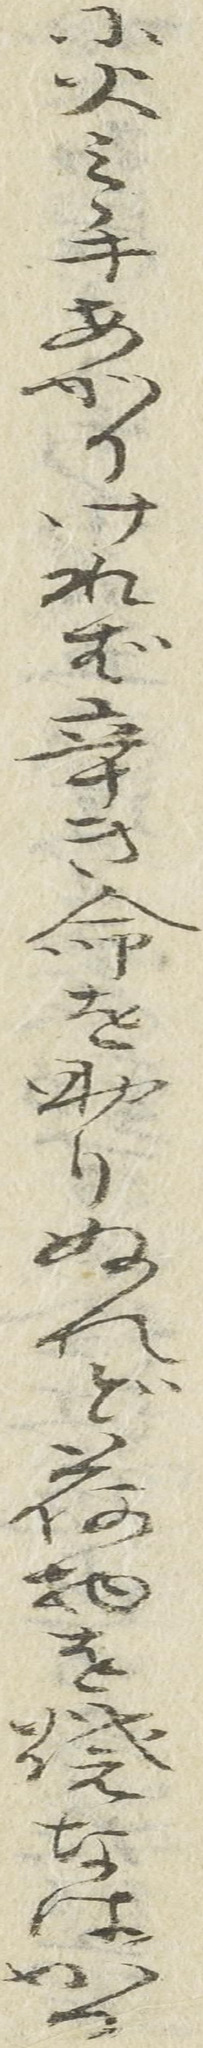に火之手あがりければ辛き命を助りぬれど荷物を焼なはかつ
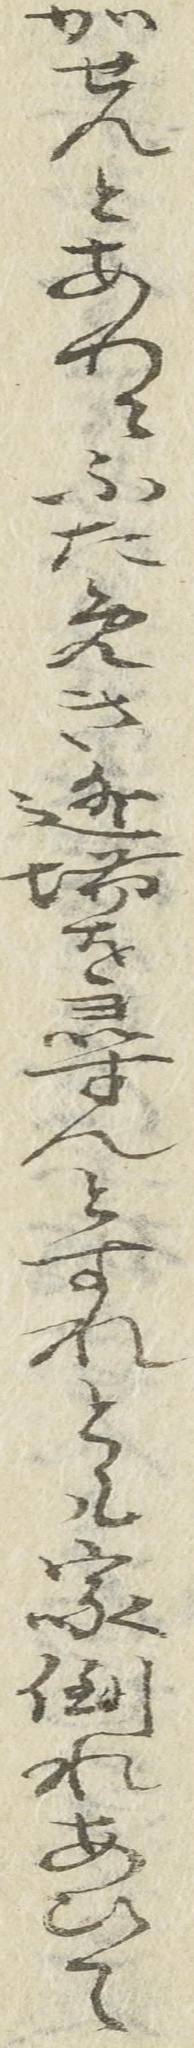かせんとあわてふためき逃場を尋んとすれとも家倒れあひて
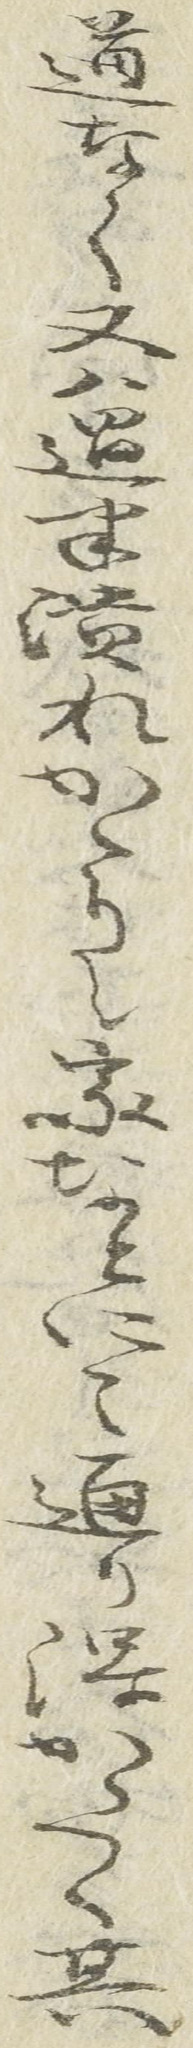道なく又は過半潰れかゝりし家なとにて通り得かたく其
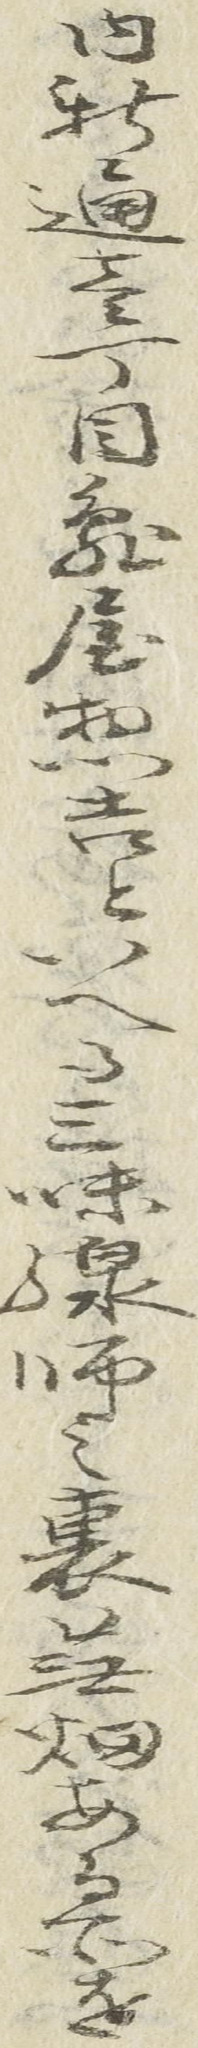内新通壱丁目亀屋惣吉といへる三味線師之裏蕪畑ある所を
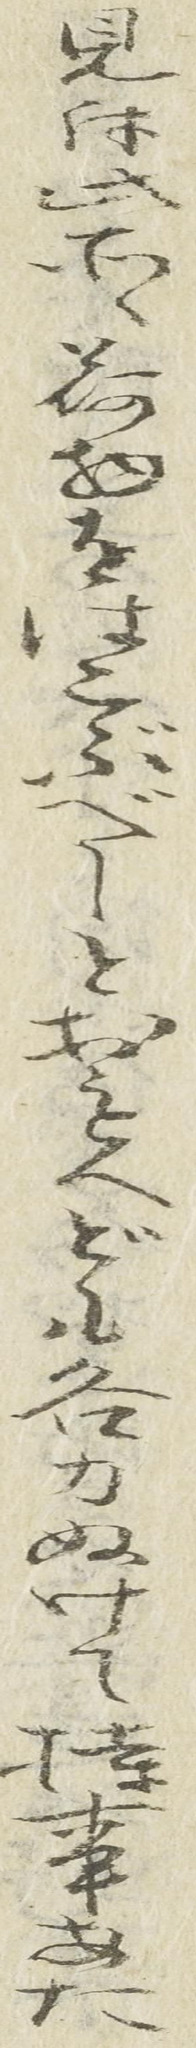見付此所へ荷物をはこぶべしとおもへども各力ぬけて持事あた
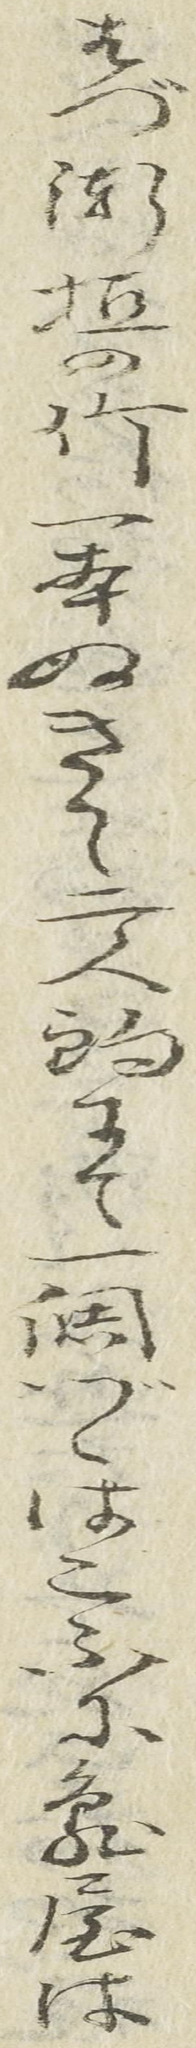はづ漸垣の竹一本ぬきて二人釣にて一個づゝはこふに亀屋は
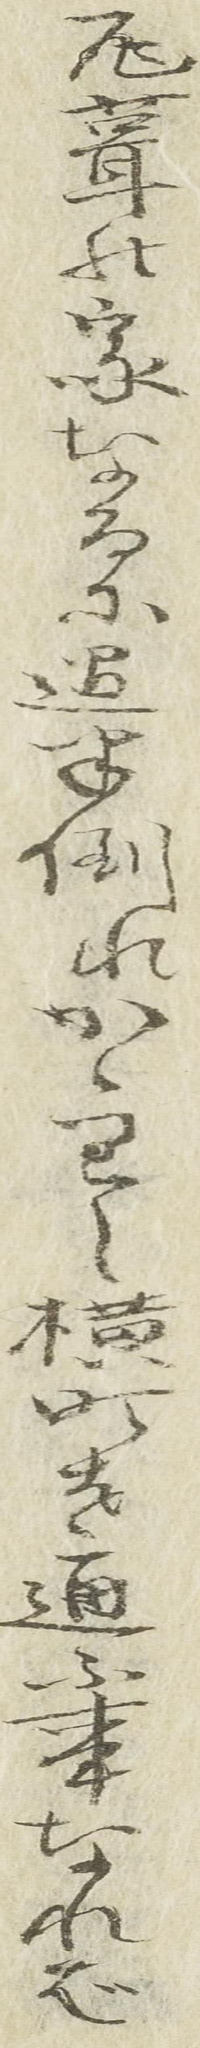瓦葺の家なるに過半倒れかゝりし横町を通ふ事なれば
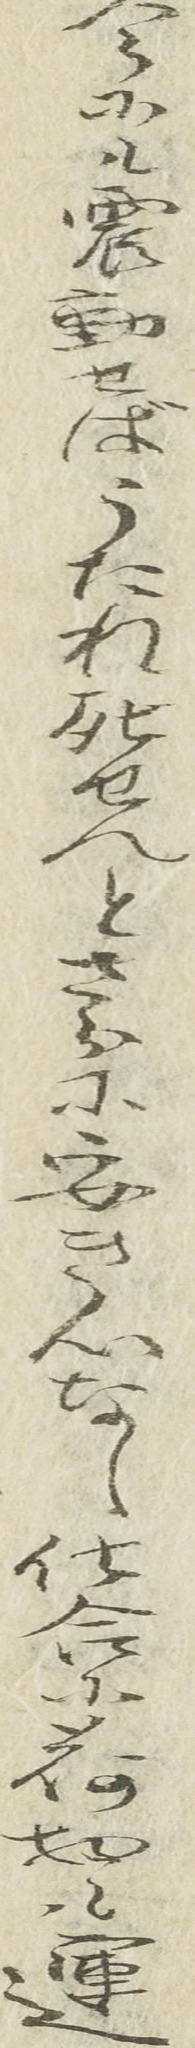今にも震動せばうたれ死せんとさらに安き心なし仕合に荷物も運
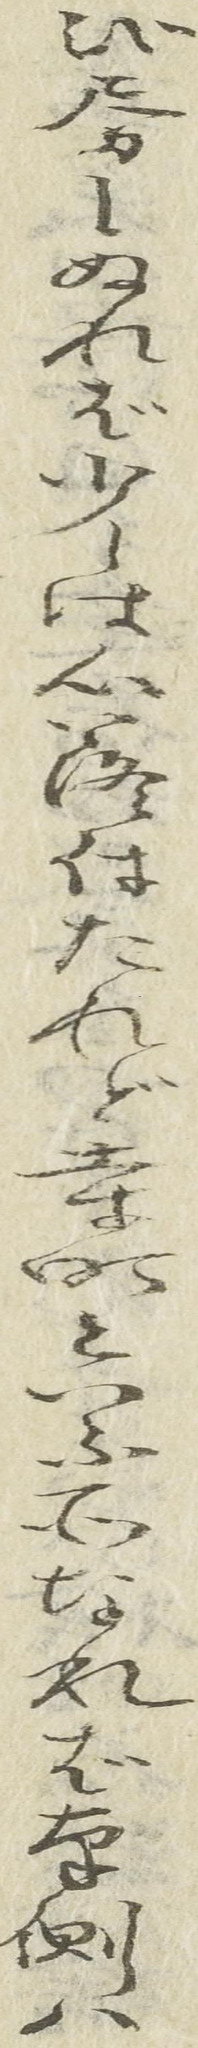び尽しぬれば少しは心落付たれど寺町といふ所なれば南側ハ
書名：地震前兆集　全
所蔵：東京大学地震研究所図書室 Earthquake Research Institute Library, The University of Tokyo, JAPAN
